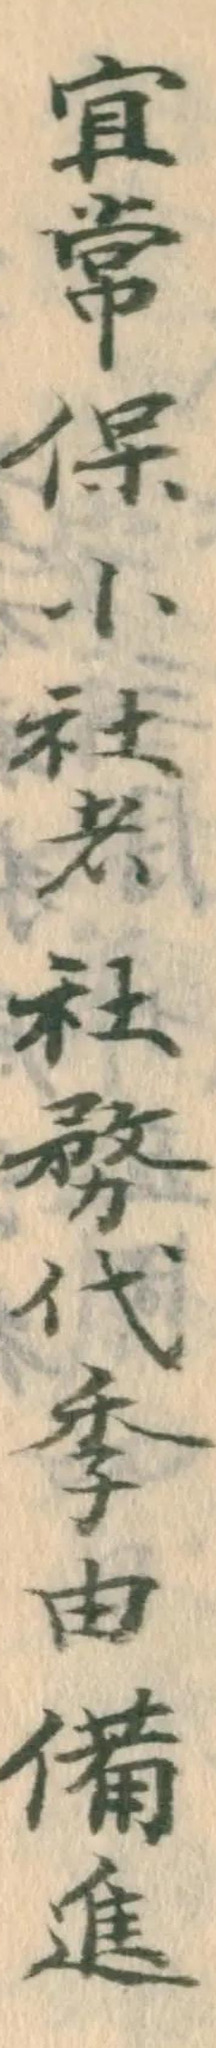宜常保小社者社務代季由備進
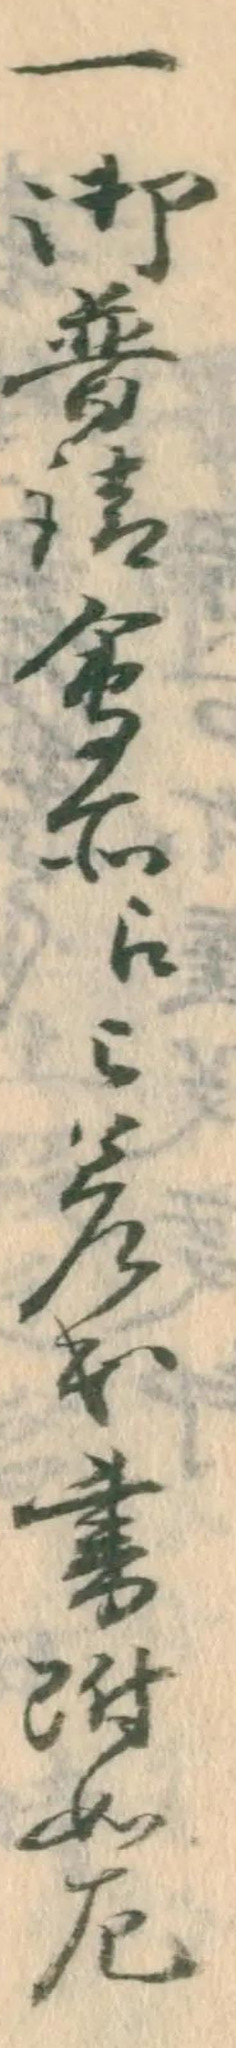一御普請会所江被差出書附如左
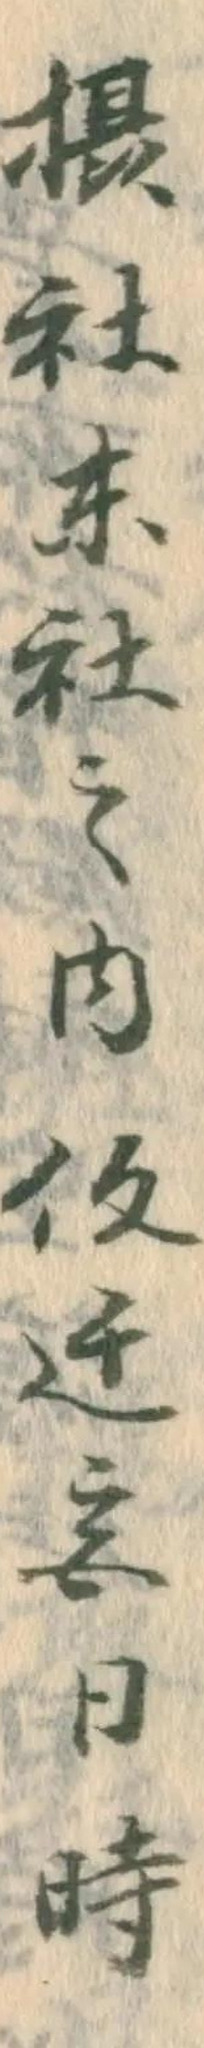摂社末社之内仮迁宮日時
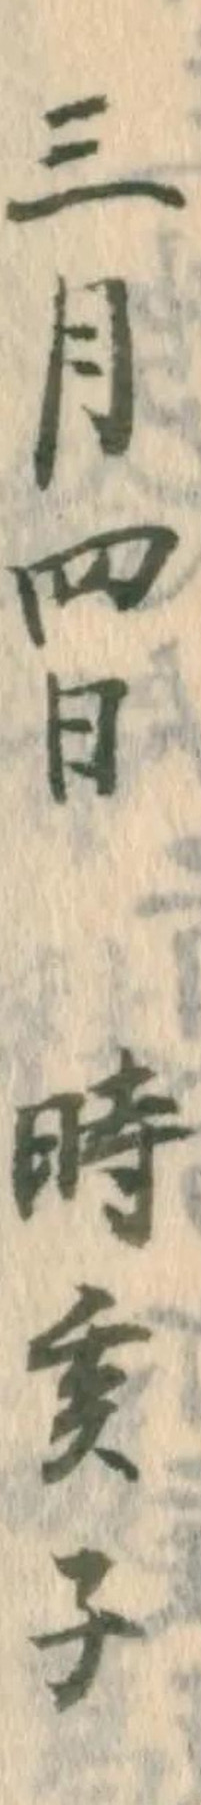三月四日時亥子
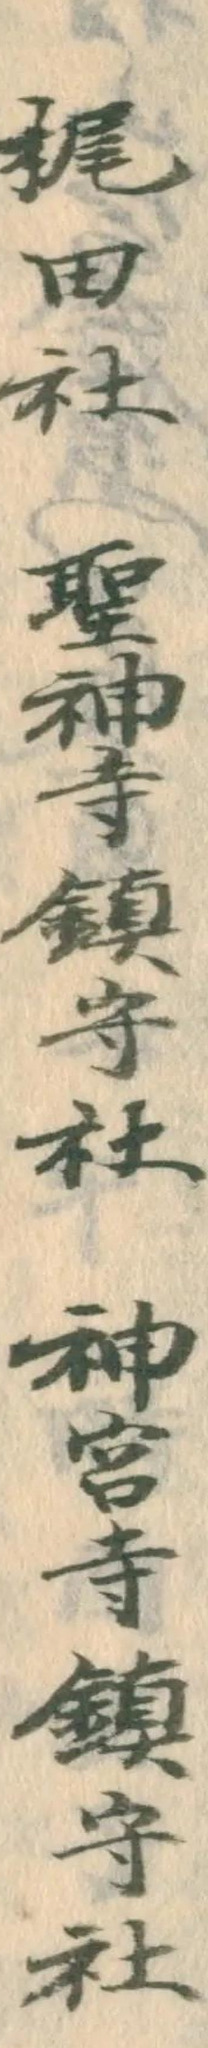梶田社聖神寺鎮守社神宮寺鎮守社
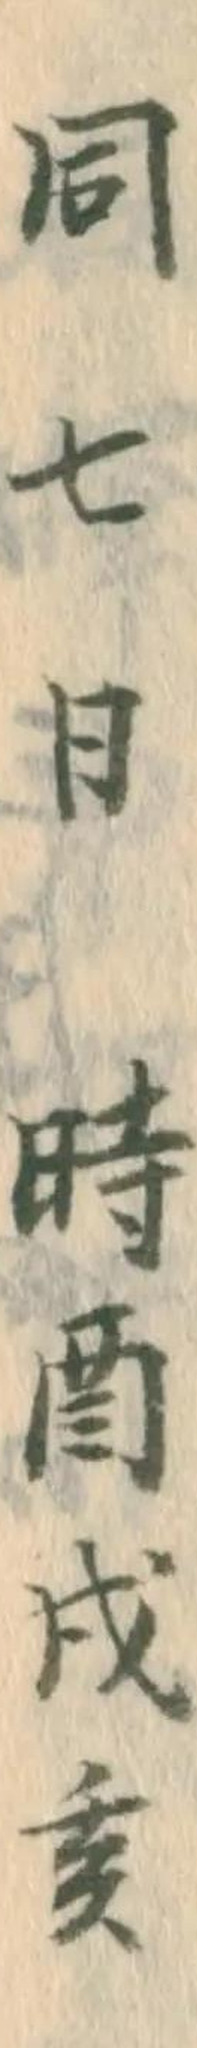同七日時酉戌亥
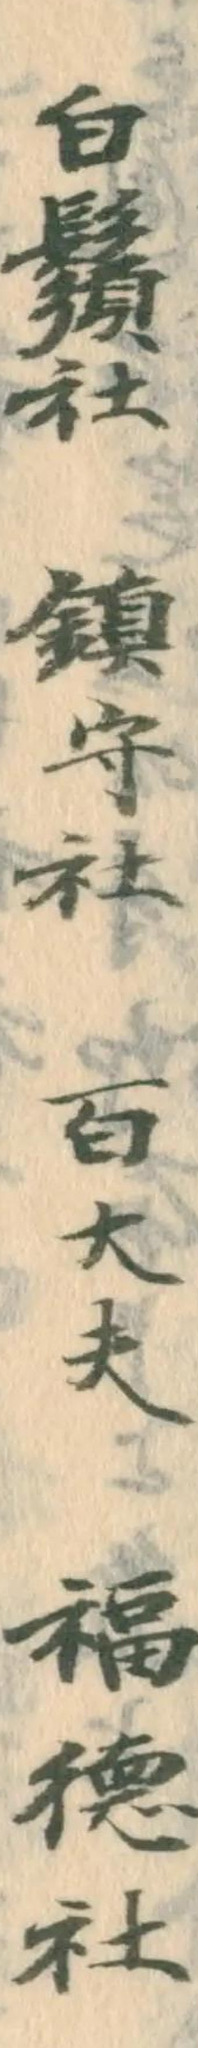白鬚社鎮守社百大夫福徳社
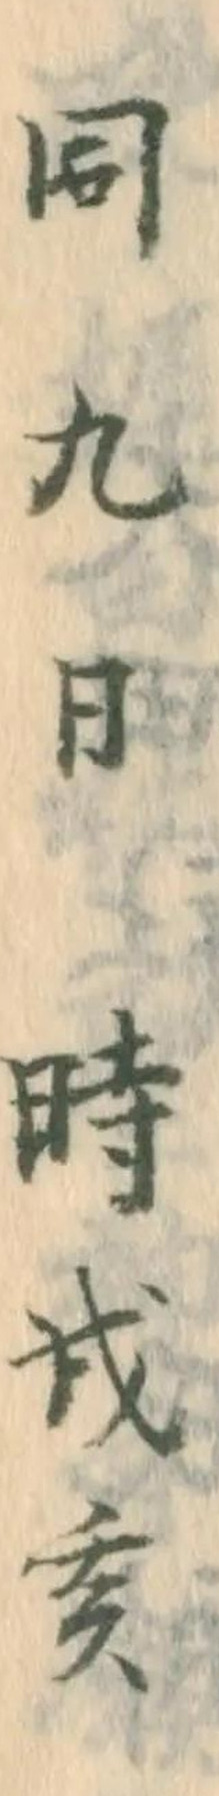同九日時戌亥

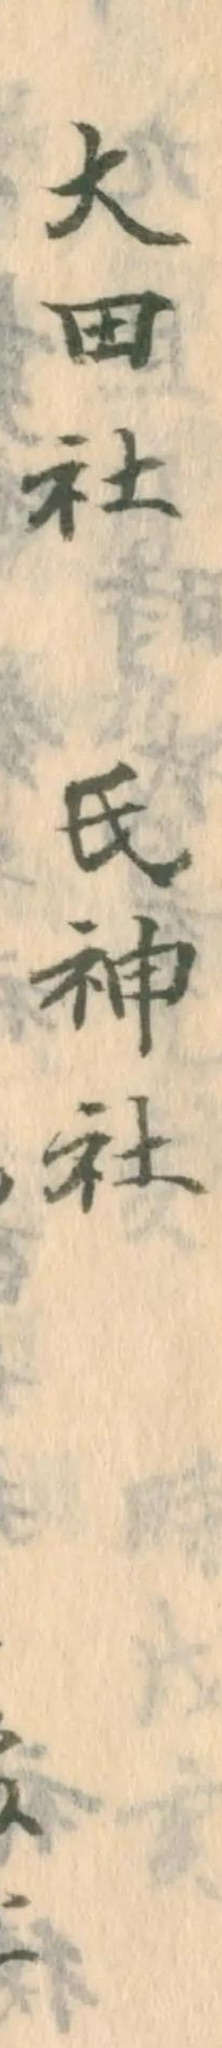大田社氏神社
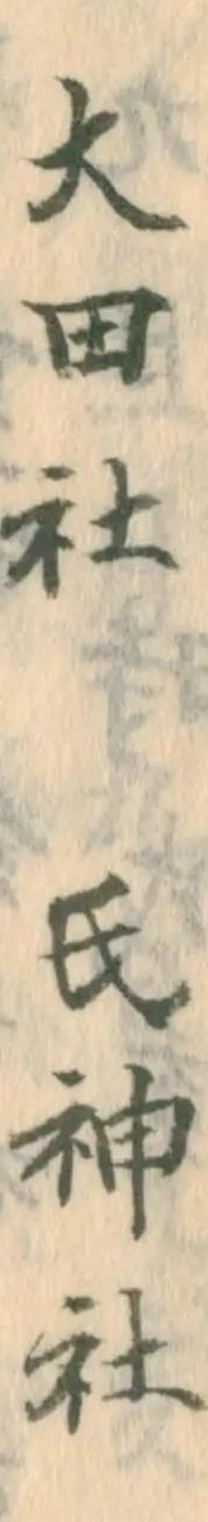大田社氏神社
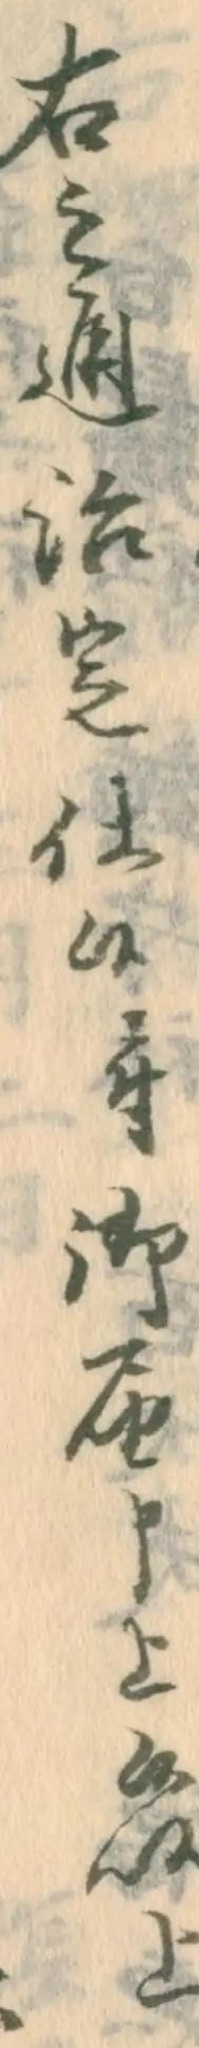右之通治定仕候ニ付御届申上候以上
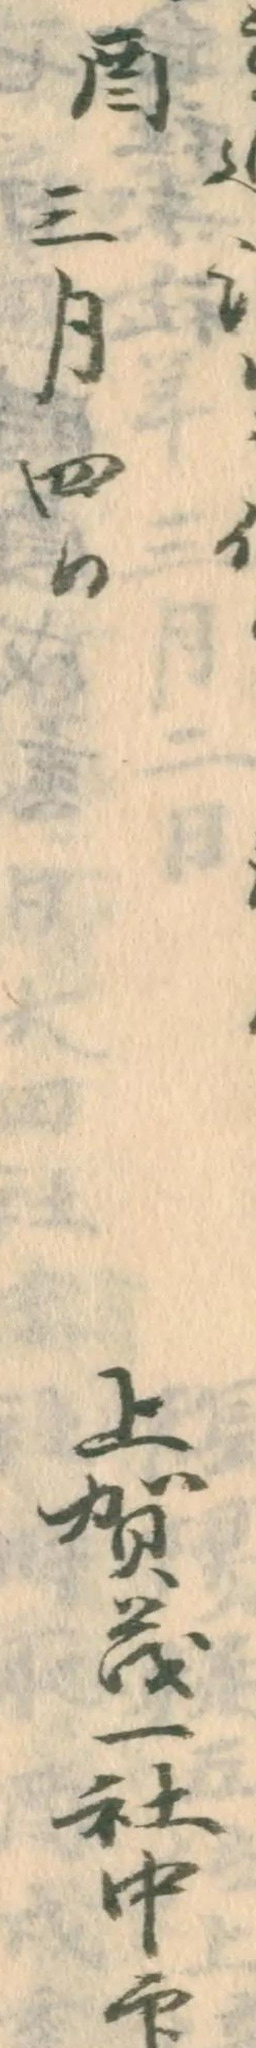酉三月四日上賀茂一社中印
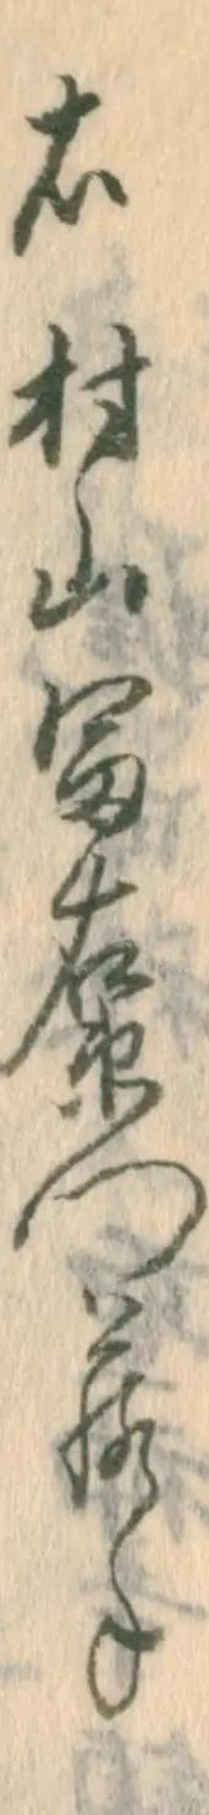右村山冨右衛門蔵手
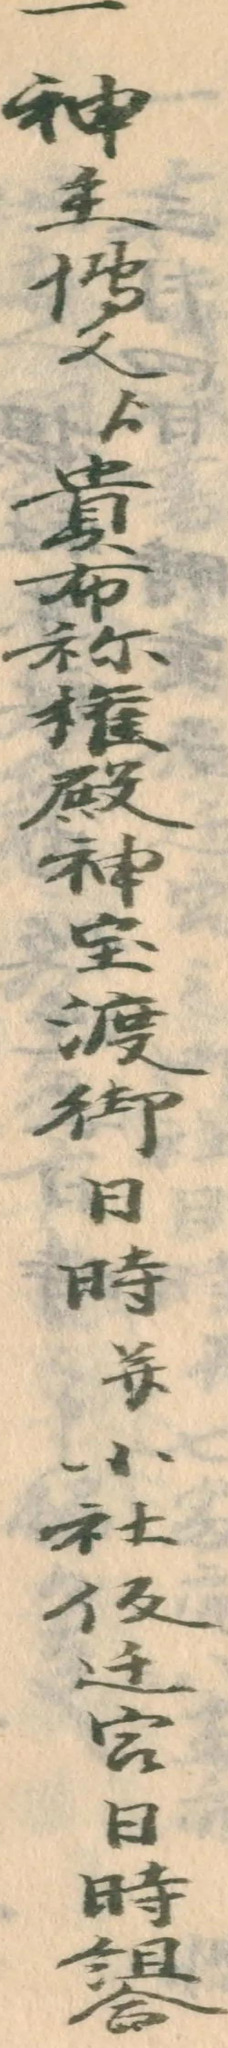一神主伝之ゟ貴布祢権殿神宝渡御日時并小社仮迁宮日時組合
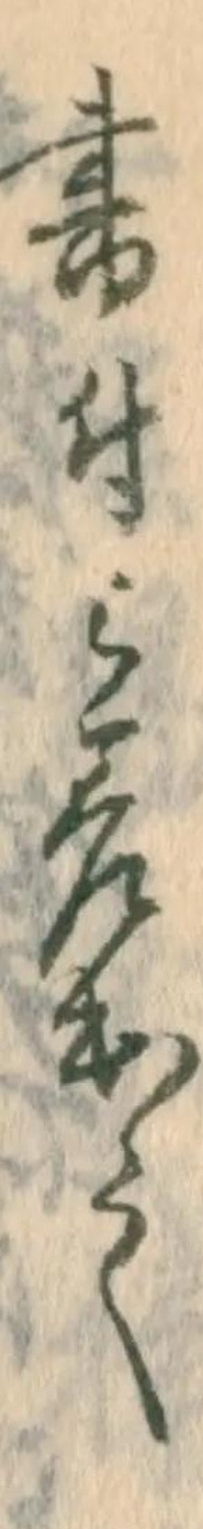書付被差出之
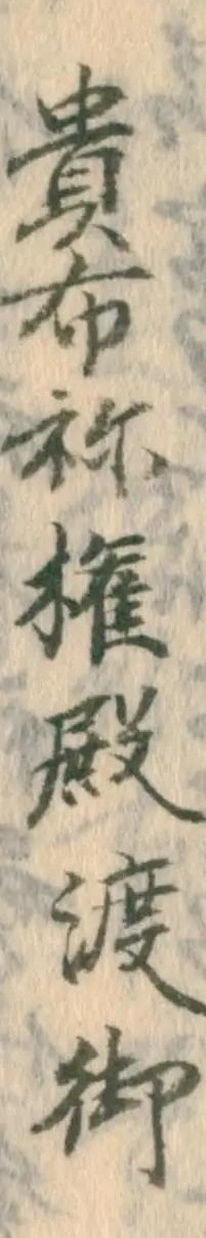貴布祢権殿渡御
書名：賀茂社記録. 第17冊
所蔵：国立国会図書館 National Diet Library, JAPAN
